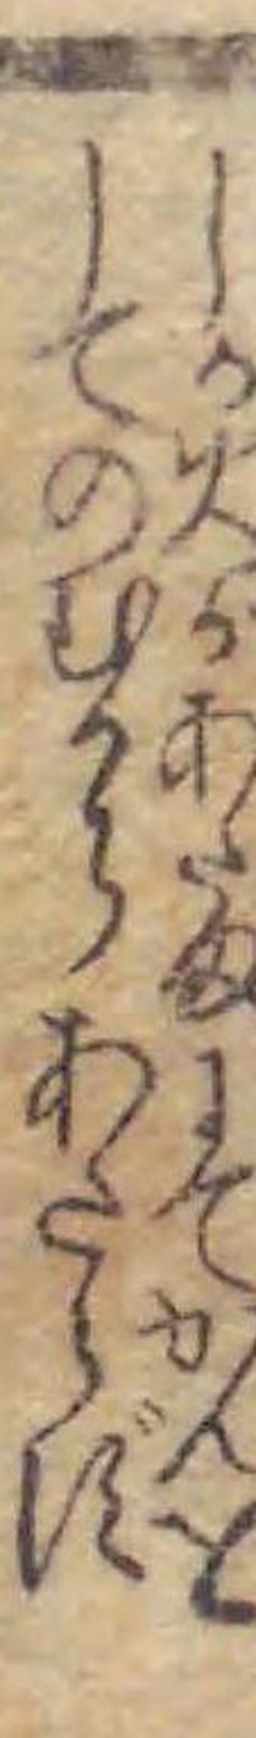してのむからあたらず
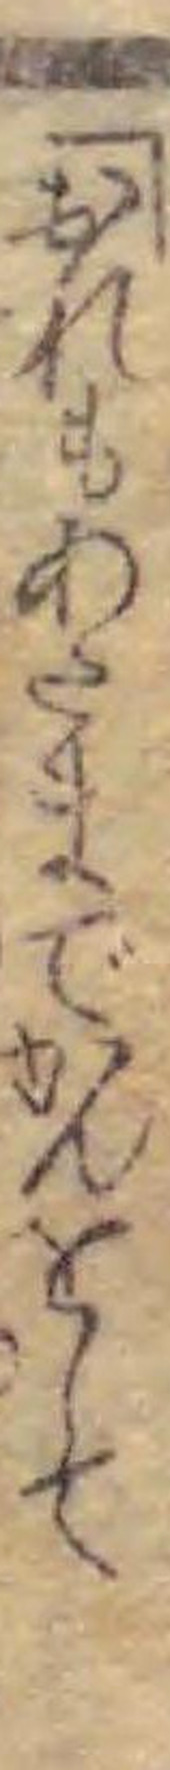〽おれもあたまでかんをして
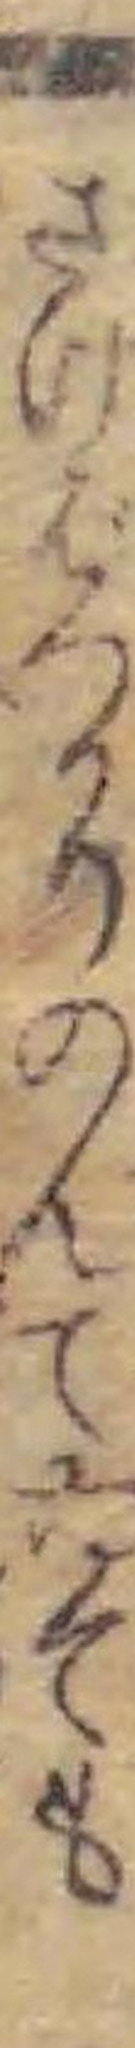さけばつかりのんてゐても
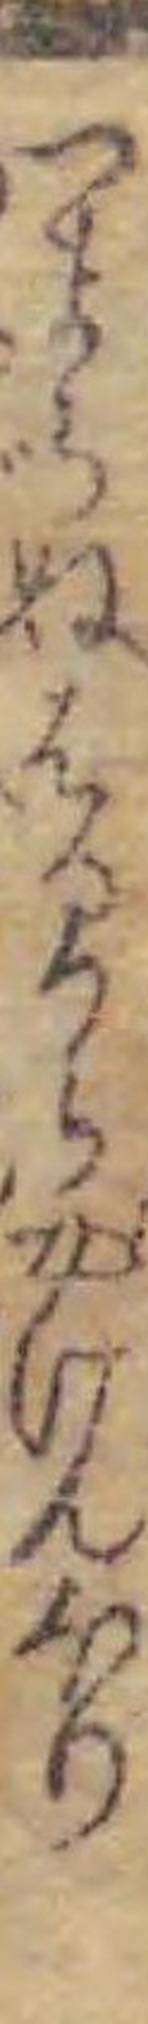つまらぬはるからやけんほり
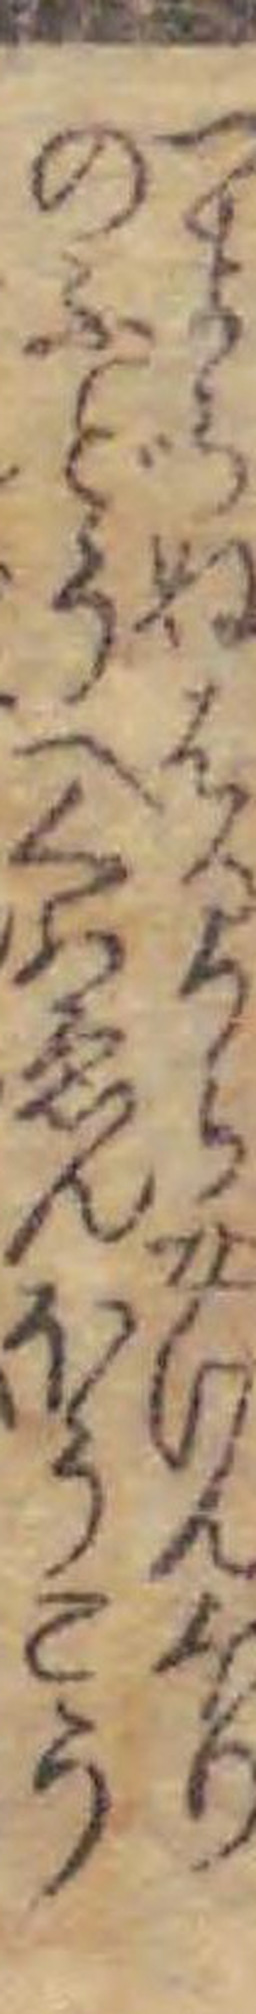のふどうへくはゑんほうこう
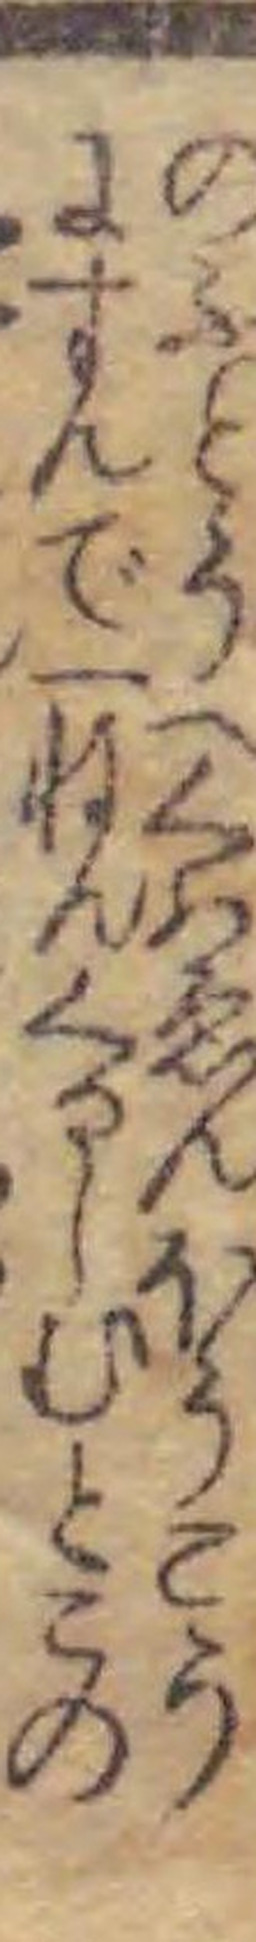にすんで一ねんくるしむとこの
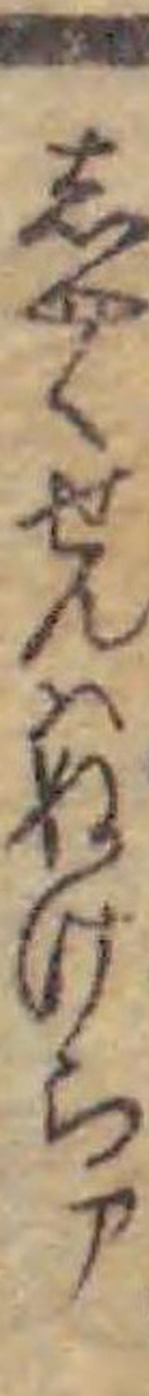しやくせんはぬけらア
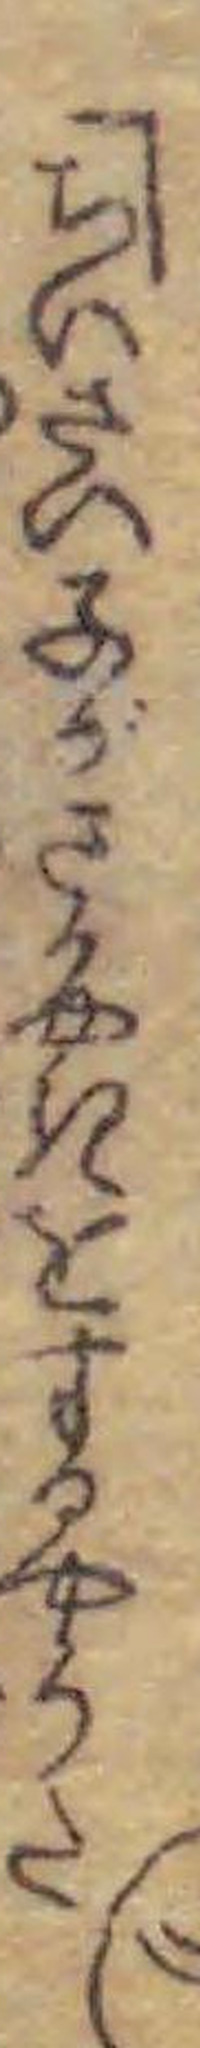〽ちいさい子がさかやきをするやうた
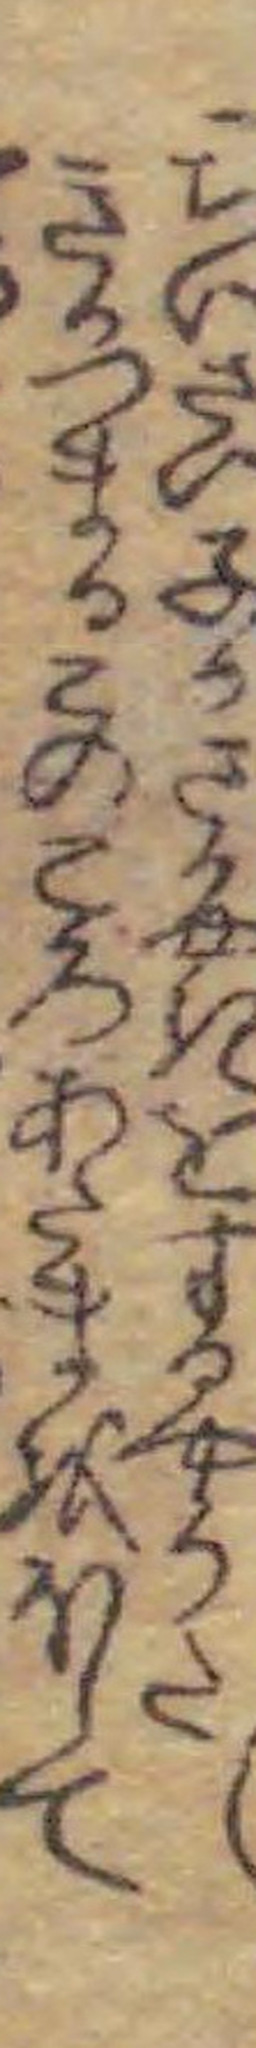きかつまるこのころあたまをほして
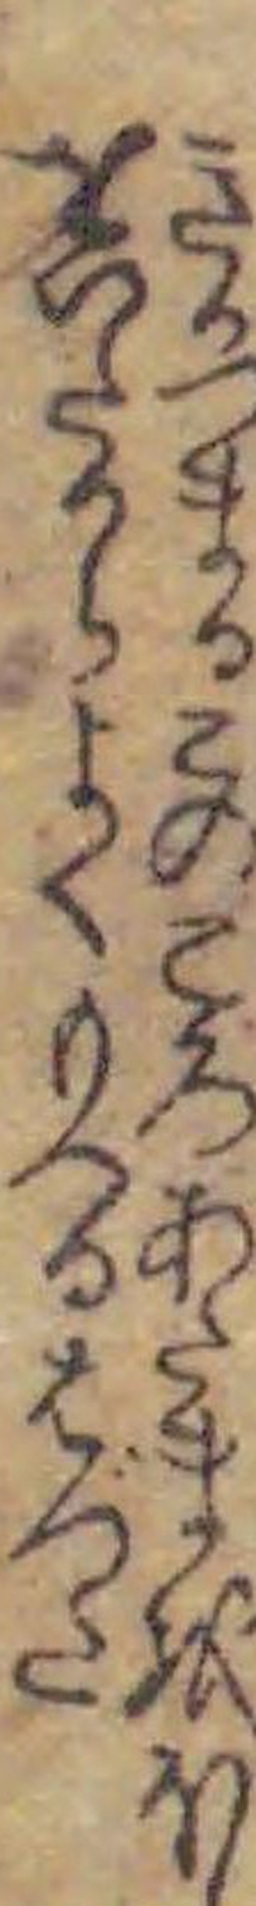をいたからよくもへるはづた
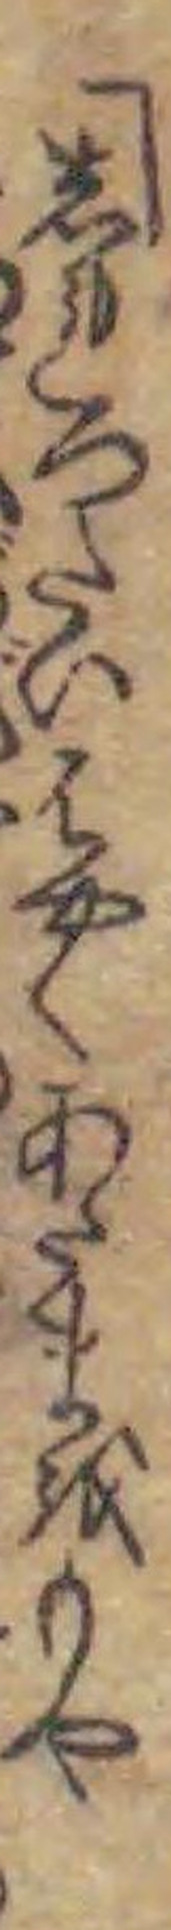〽しれつたいはやくあたまをもや
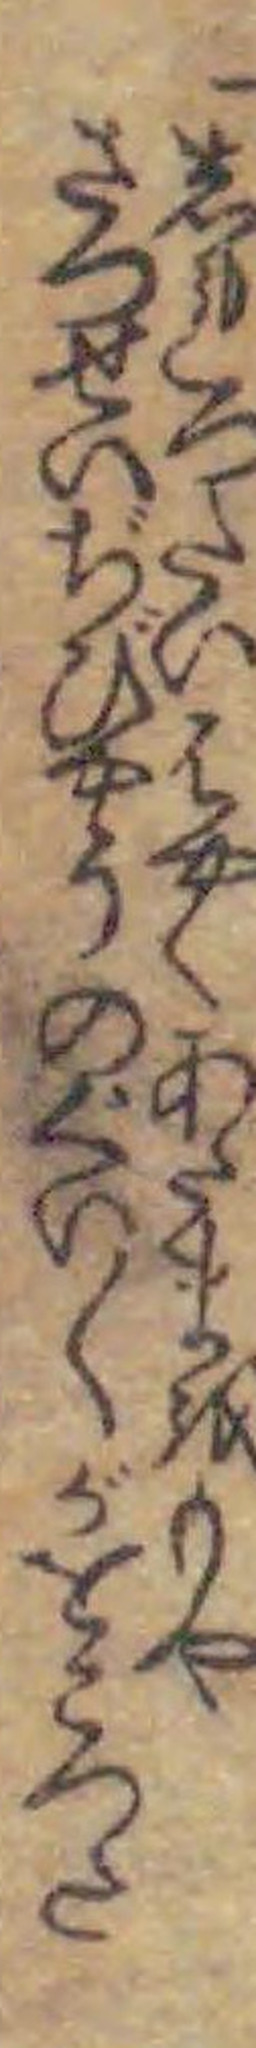さつせいぢびやうのぐい〳〵がをこつた

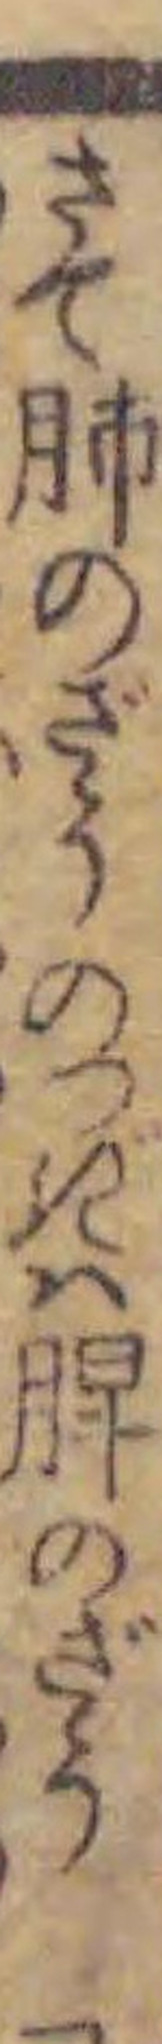さて肺のざうのつぎは脾のざう
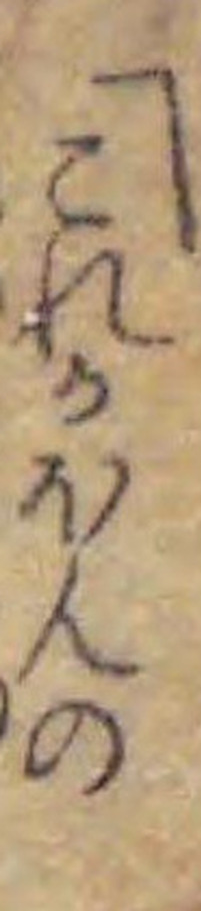〽これかほんの
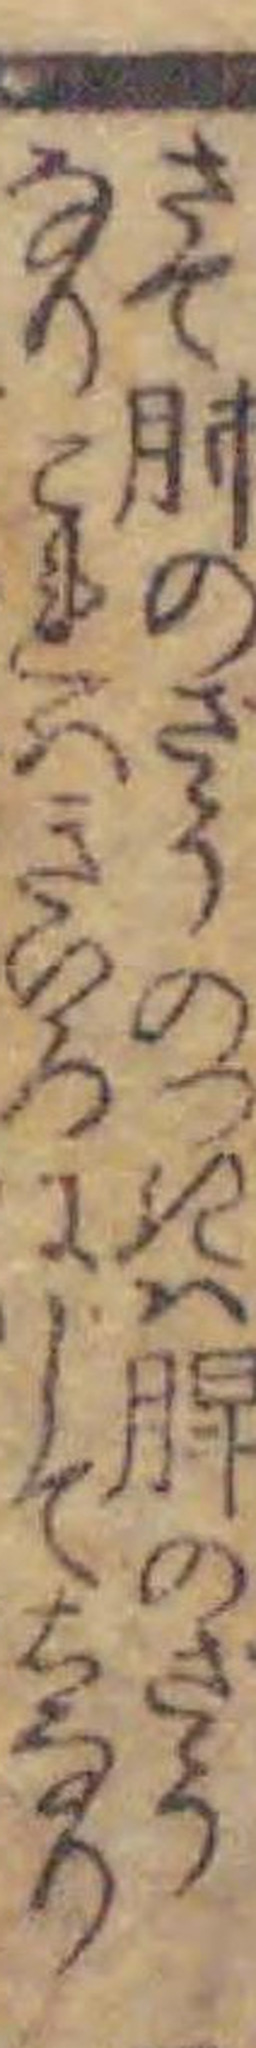なりこれはきいろにして大なり
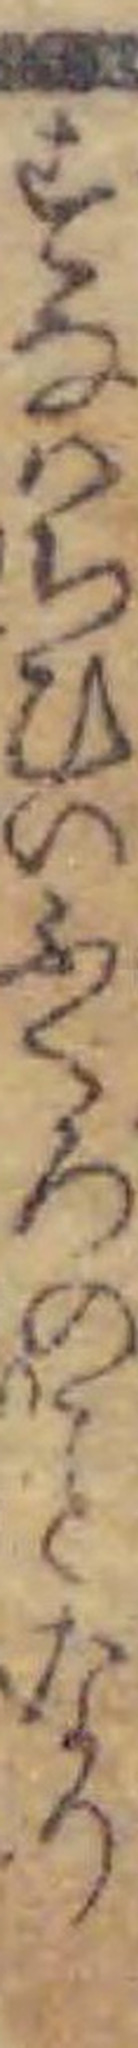すなはちひいふくろのことなり
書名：十四傾城腹之内 : 3巻
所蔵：国立国会図書館 National Diet Library, JAPAN
